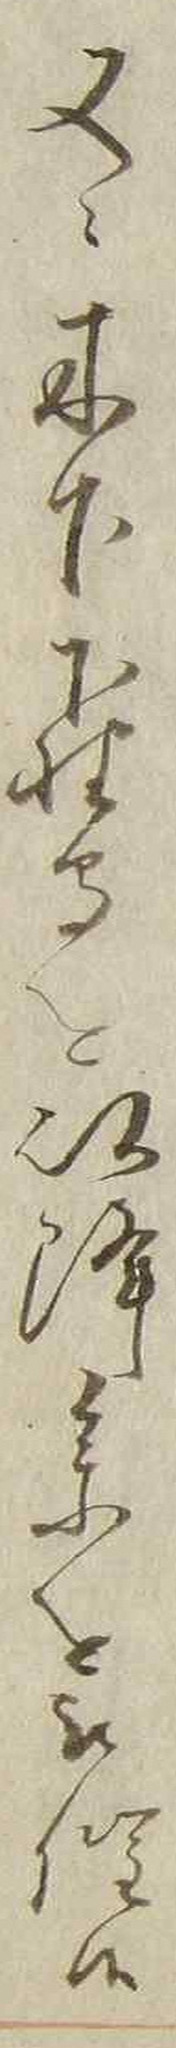又々木下下野守を以降参を被催候

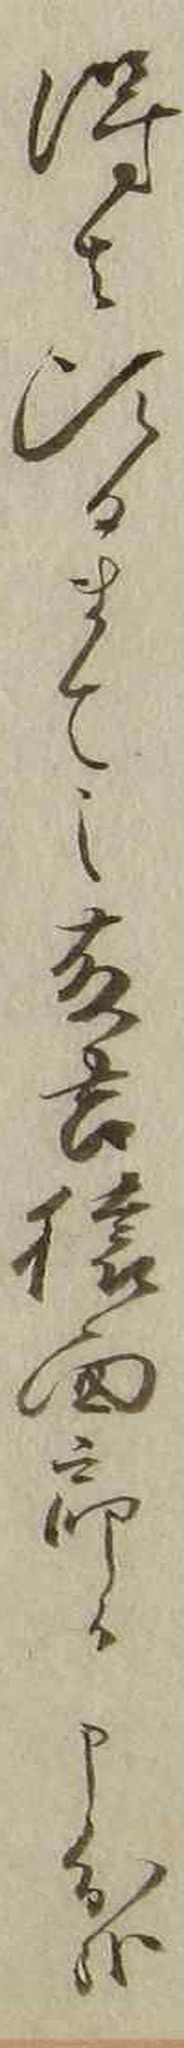得者頃日まて之藤吉猿面郎か申分哉
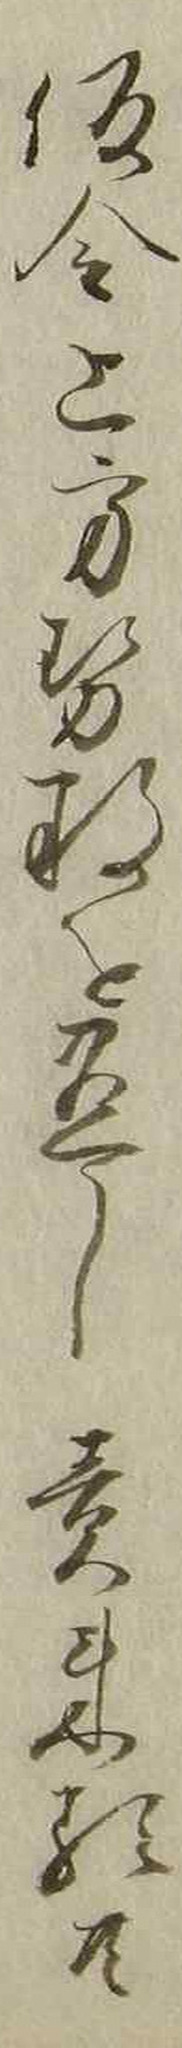仮令上方勢数を有之責来る共
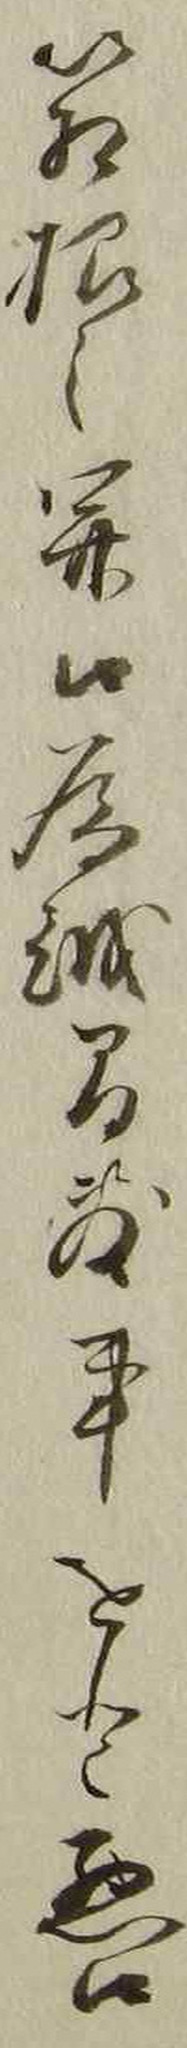箱根之関候為越間敷事をと悪口
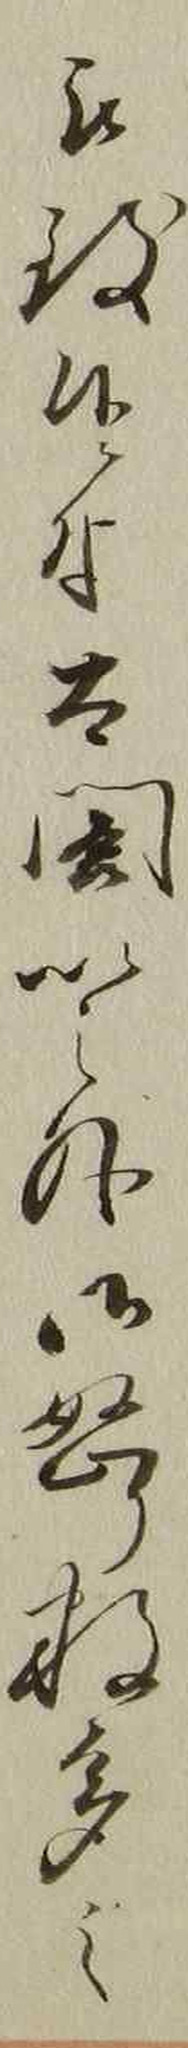被致候ニ付太閤以之外御怒り数多之
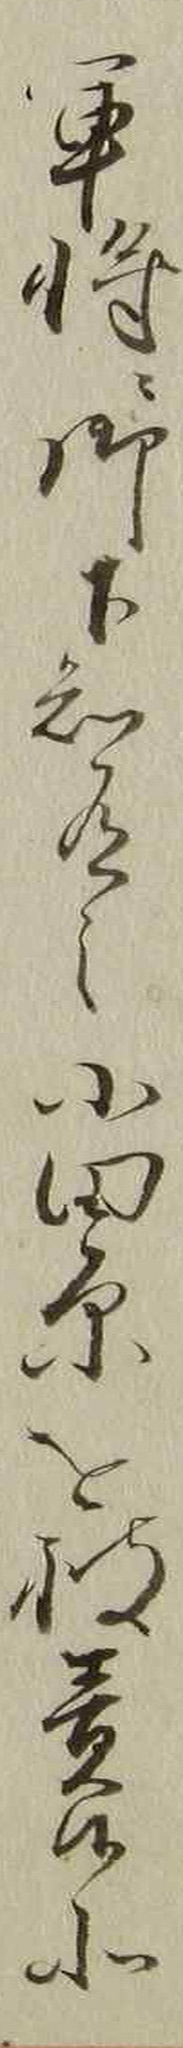軍将ニ御下知有之小田原を被責候北
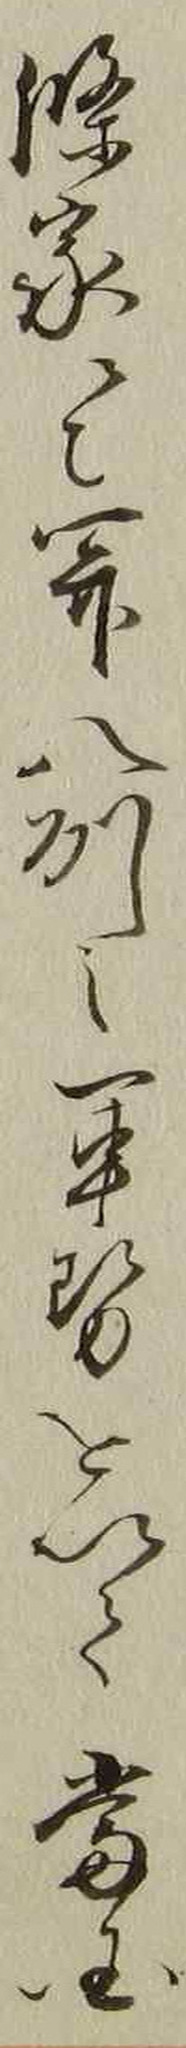条家ニて関八州之軍勢を以て当国
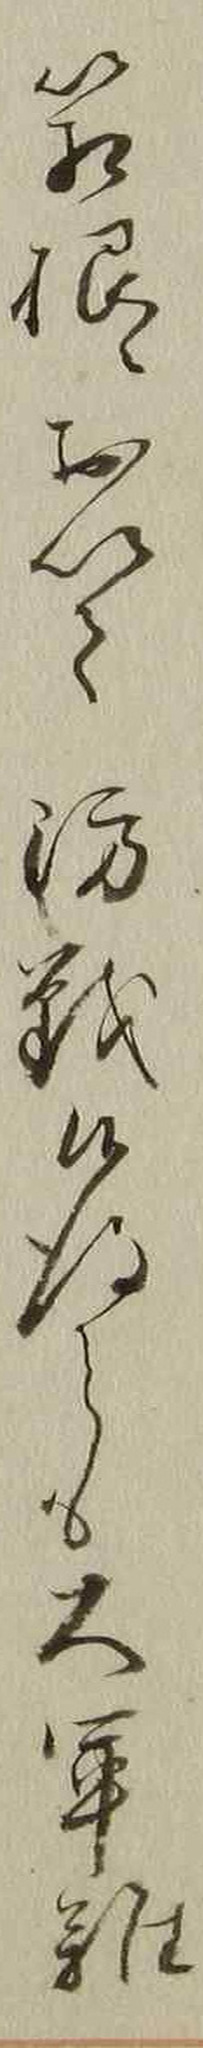箱根ニおいて防戦候得とも大軍難
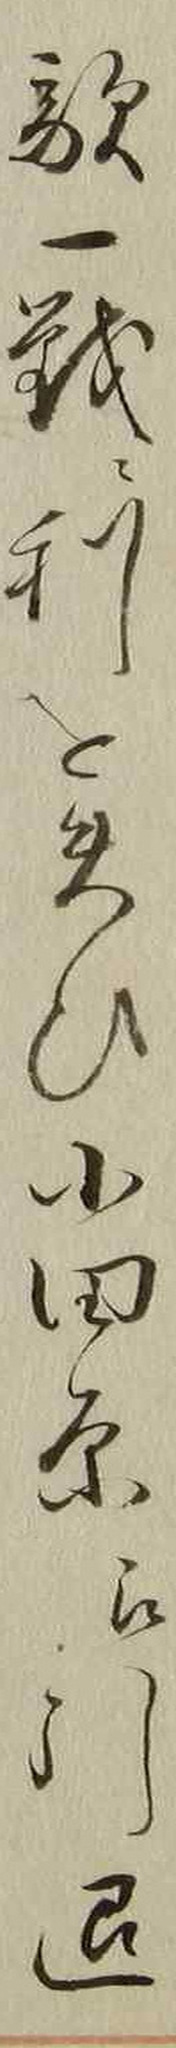敵一戦ニ利を失ひ小田原江引退
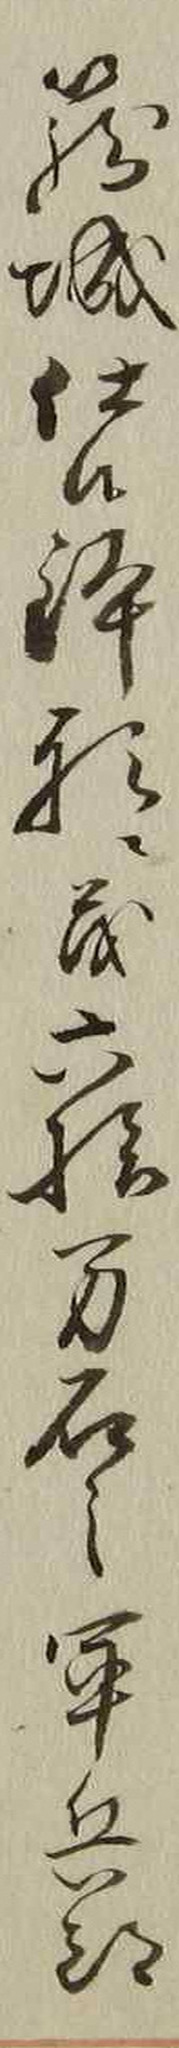籠城仕候鉢形ニも六拾万石之軍兵都
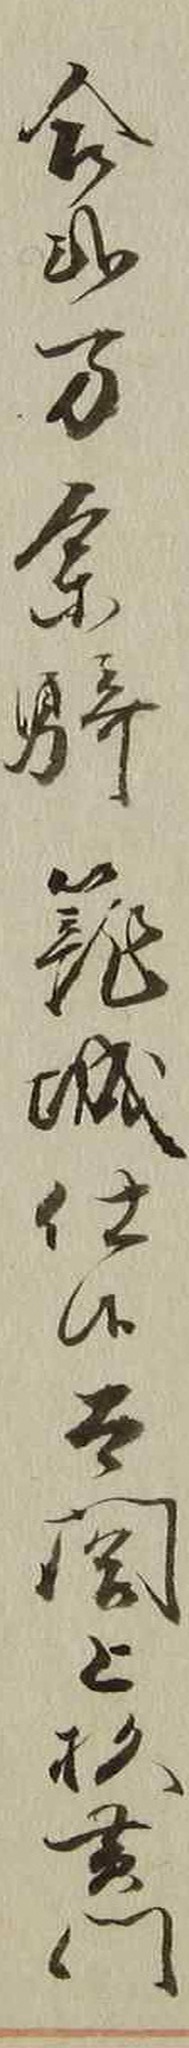合弐万余騎籠城仕候太閤上杉黄門
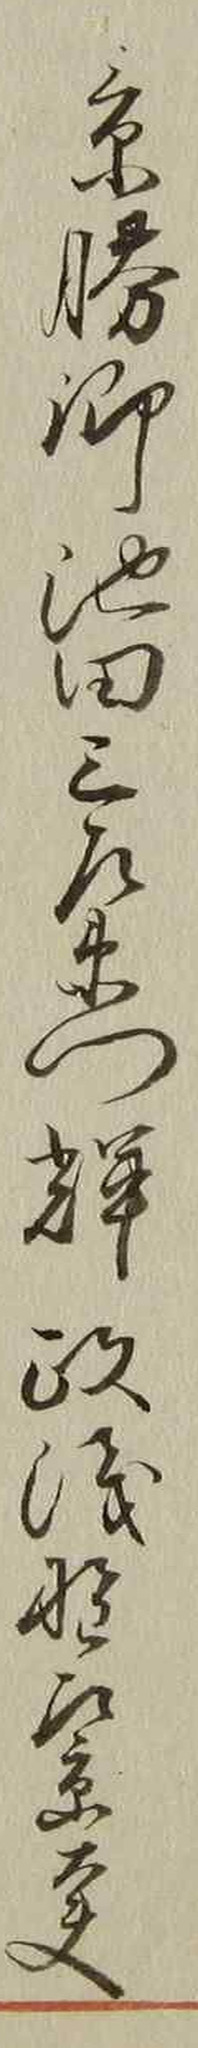景勝卿池田三左衛門輝政浅野左京大夫
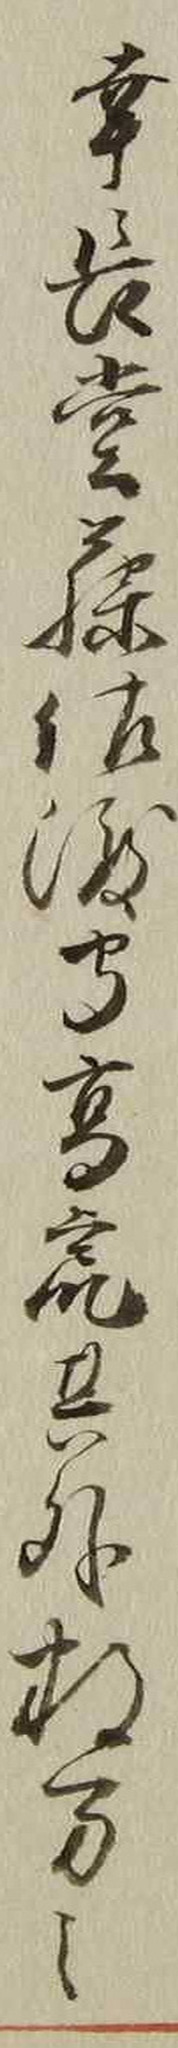幸長堂藤佐渡守高虎其外数万之
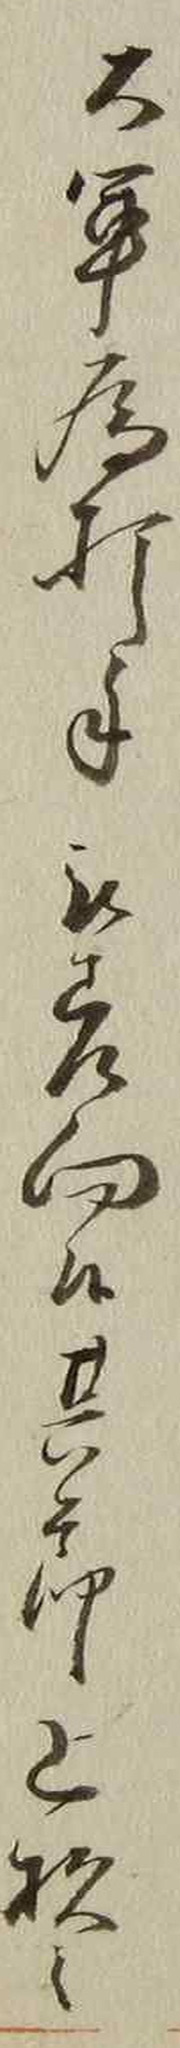大軍為打手被差向候其節上杉之
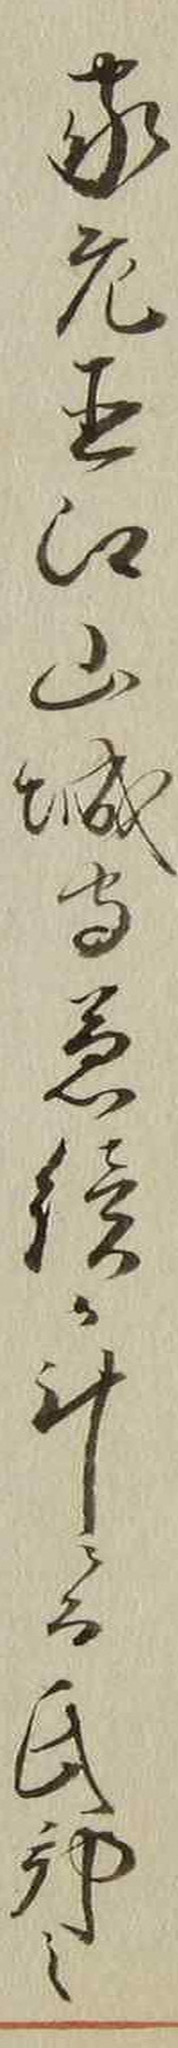家老直江山城守兼続か計ニ而氏邦之
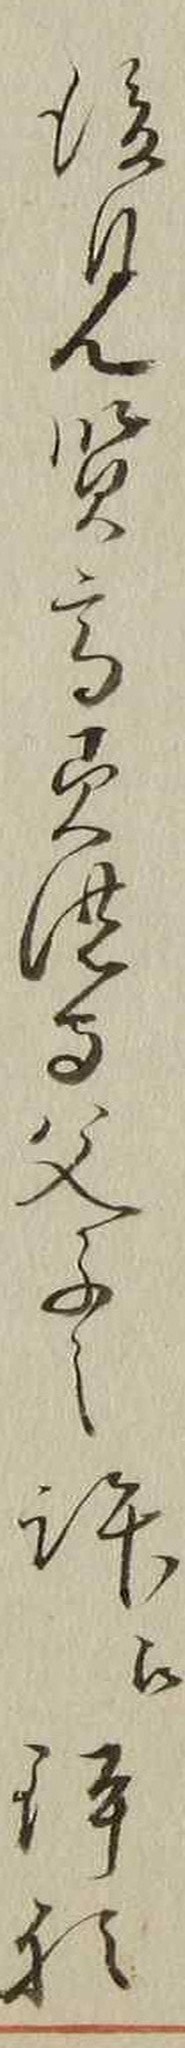後見質高美濃守父子之許江鉢形
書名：諸士系譜　巻之122　よ之部5
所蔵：会津若松市立会津図書館
